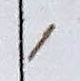1
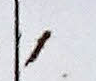1
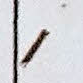1
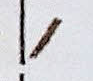1
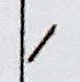1
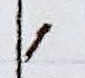1
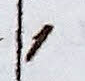1
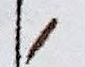1
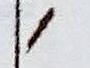1
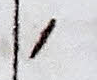1
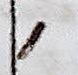1
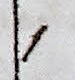1
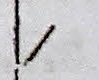1
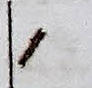1
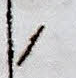1
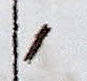1
